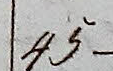45
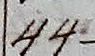44
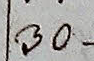30
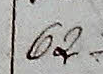62
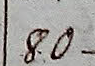80
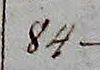84
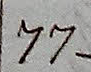77
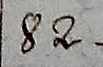82
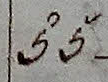55
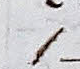1
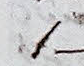1
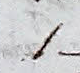1
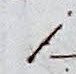1
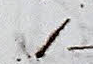1
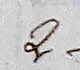2
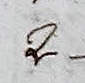2
